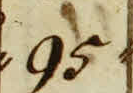95
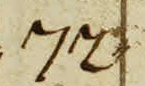72
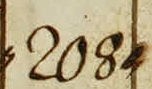208
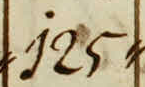125
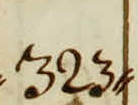323
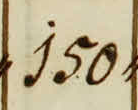150
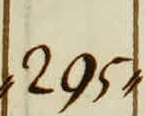295
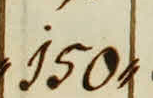150
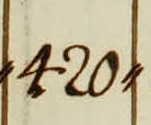420
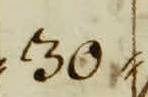30
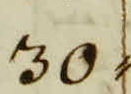30
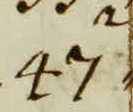47
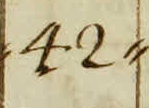42
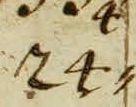24
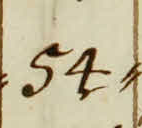54
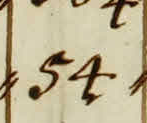54
